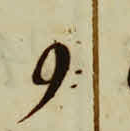9:
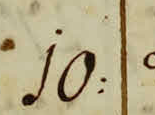10:
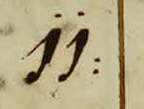11:
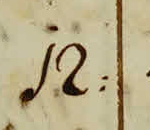12:
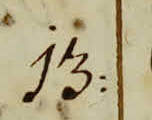13:
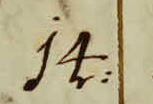14:
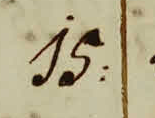15:
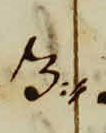3:
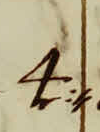4
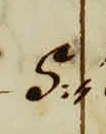5:
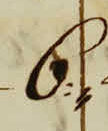6:
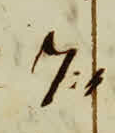7:
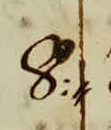8:
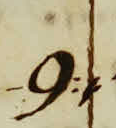9:
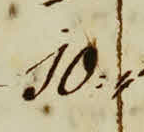10:
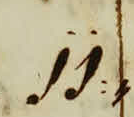11:
